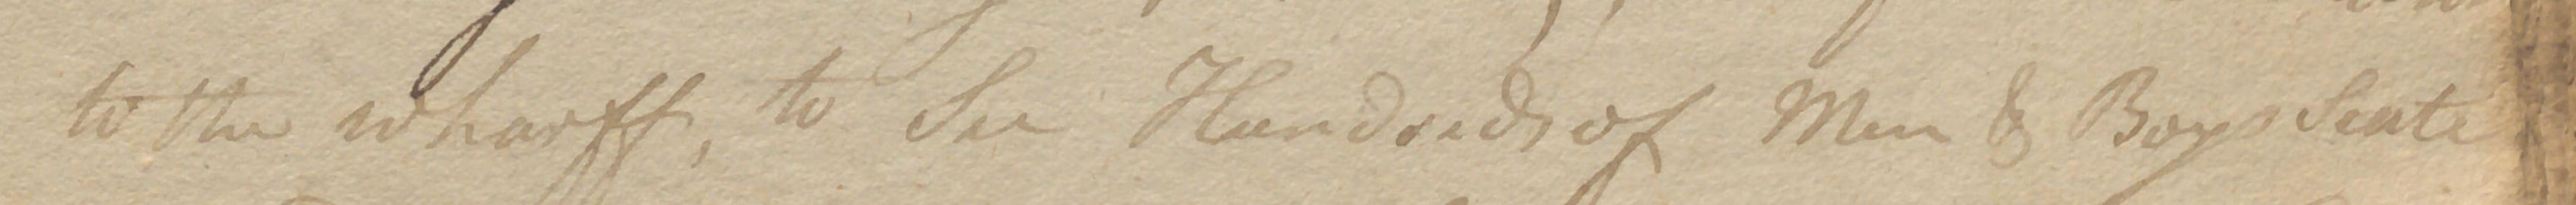to the wharff to See Hundreds of Men & Boys Seated
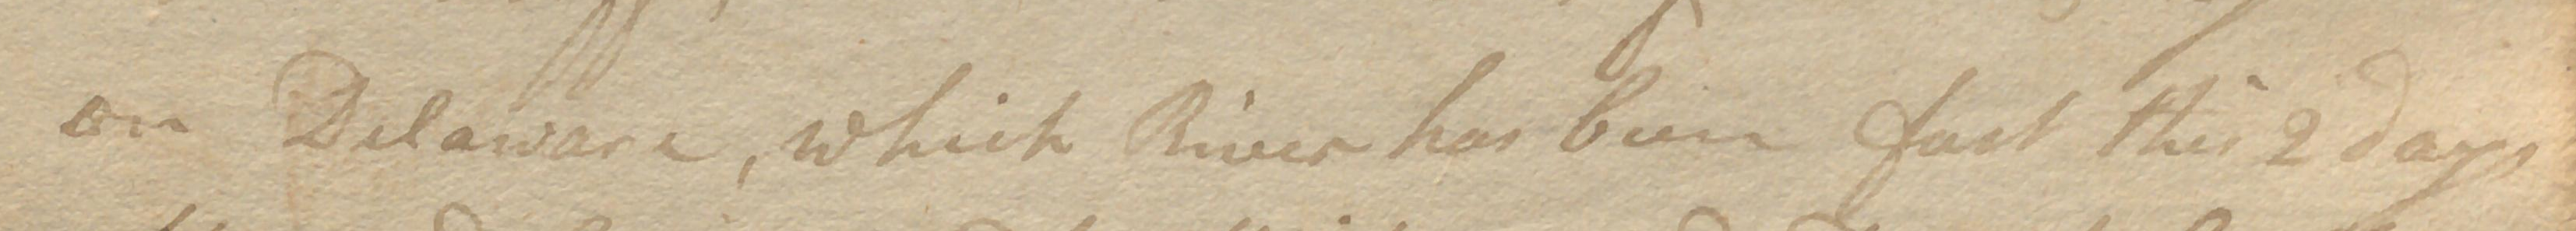on Delaware, which River has been fast this 2 days
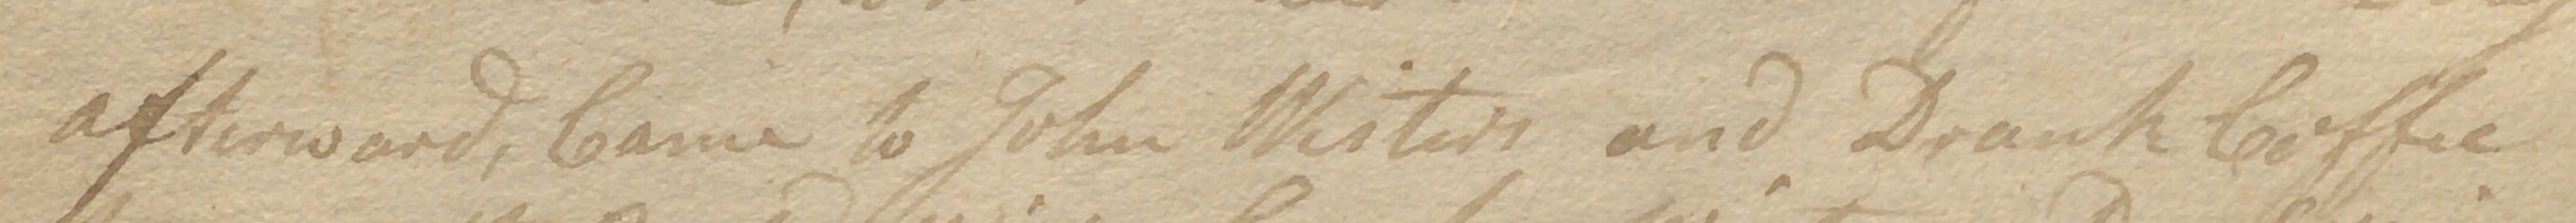afterward, Came to John Wisters asd Drank Coffee
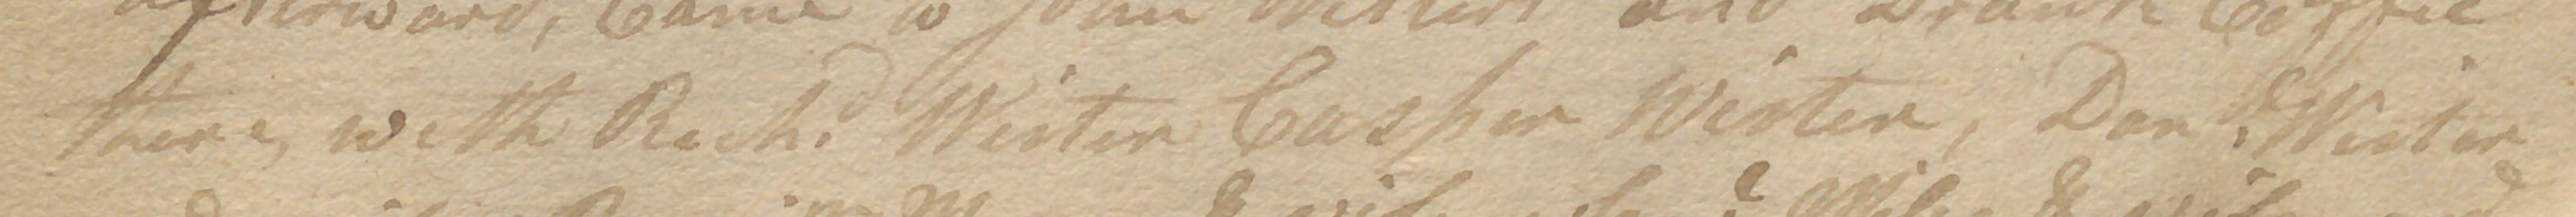there with Rich^d. Wister Casper Wister, Dan^l. Wister
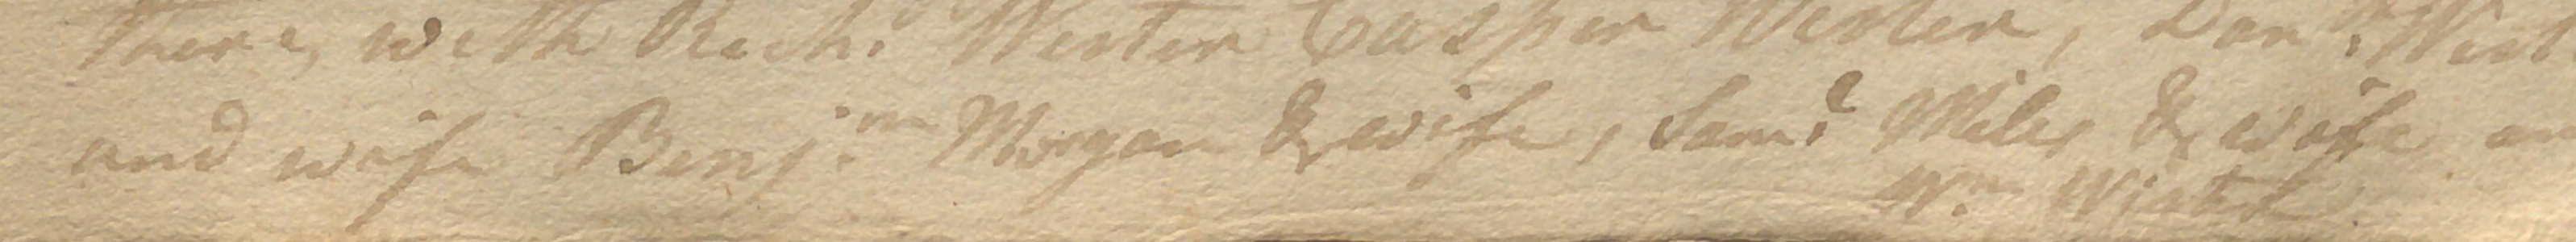and wife Benj^n. Morgan & wife, Sam^l. Miles & wife
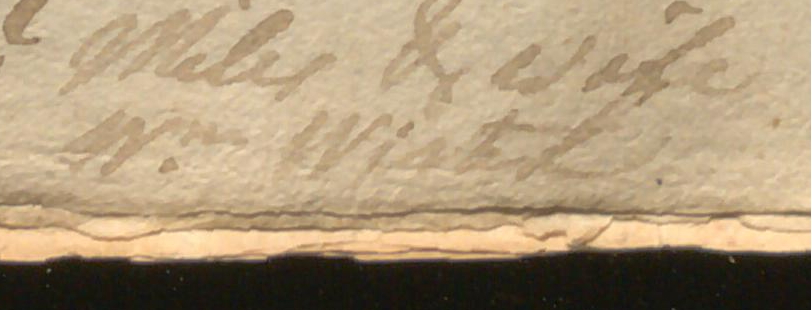W^m. Wister
